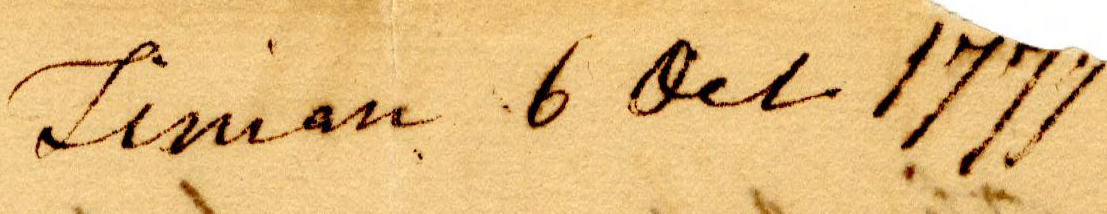Tinian 6 Oct 1777
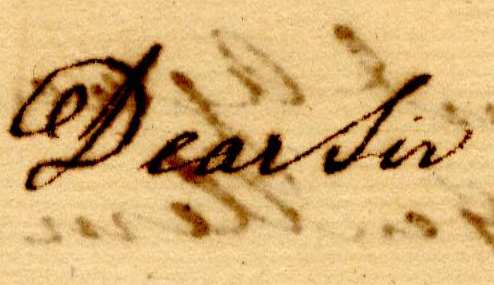Dear Sir
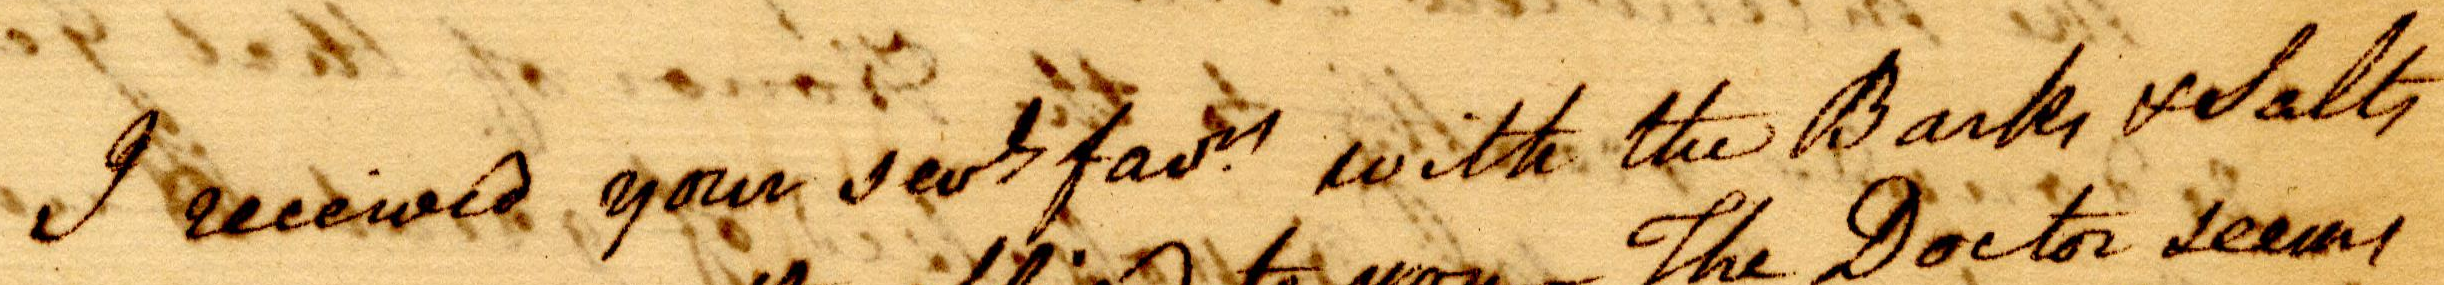I received your sev^l fav^rs. with the Barks & Salts
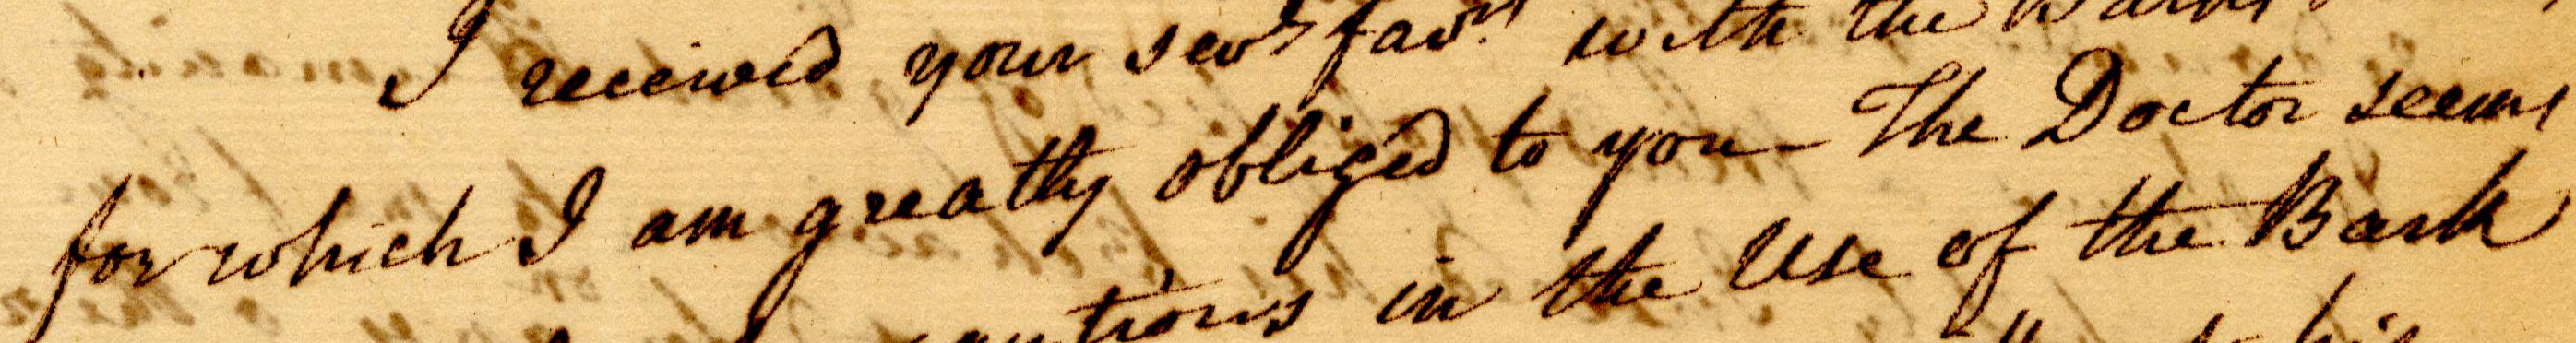for which I am greatly obliged to you. The Doctor seems
